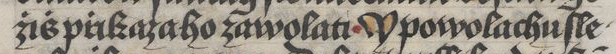żiṡ pṙikaza ho zawolati.Y powolachu ſle¬
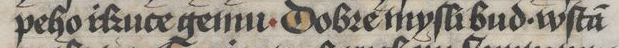peho ṙkuce gemu.Dobre myſli bud.wſtā
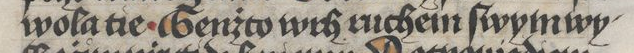wola tie.Genżto vrh ruchem ſwym wy¬
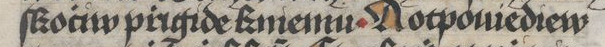ſkoċiw pṙigide k niemu.A otpouiediew
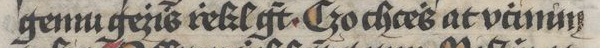gemu geżíṡ ṙekl ḡt.Czo chceṡ at vċinim
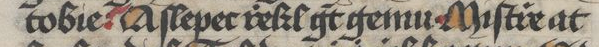tobie?A ſlepec ṙekl ḡt gemu.Miſtṙe at
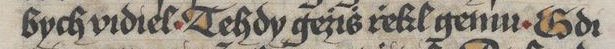bych vidiel.Tehdy geżíṡ ṙekl gemu.Gdi
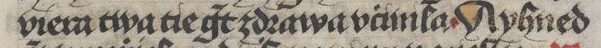víera twa tie ḡt zdrawa vċinila.A yhned
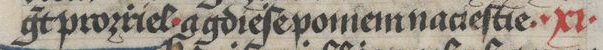ḡt prozṙiel.a gdíeẛe po niem nacieſtie. xi.
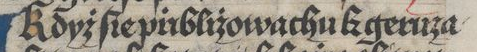Když ſie pṙibliżowachu k geruza¬
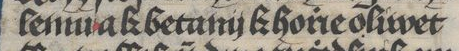lemu.a k betanij k hoṙie oliwet¬
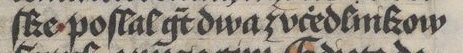ſke.poſlal ḡt dwa zvċedlnikow
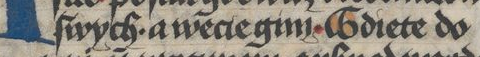ſwych.a wecie gím.Gdiete do¬
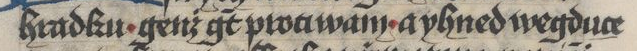hradku.genż ḡt proti wam a yhned wegduce
